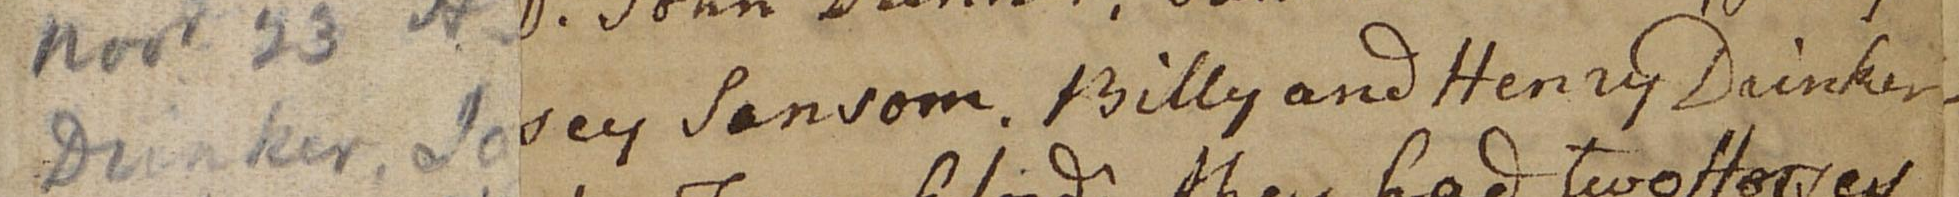Drinker, Josey Sansom. Billy and Henry Drinker
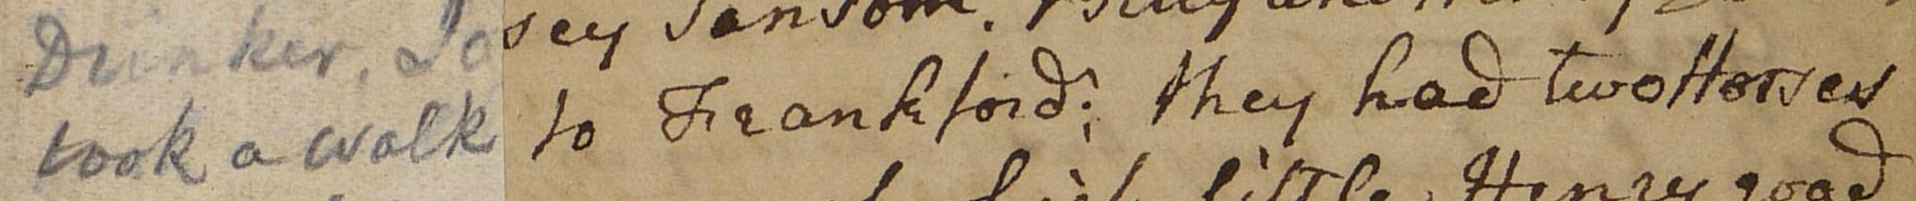took a walk to Frankford; they had two Horses
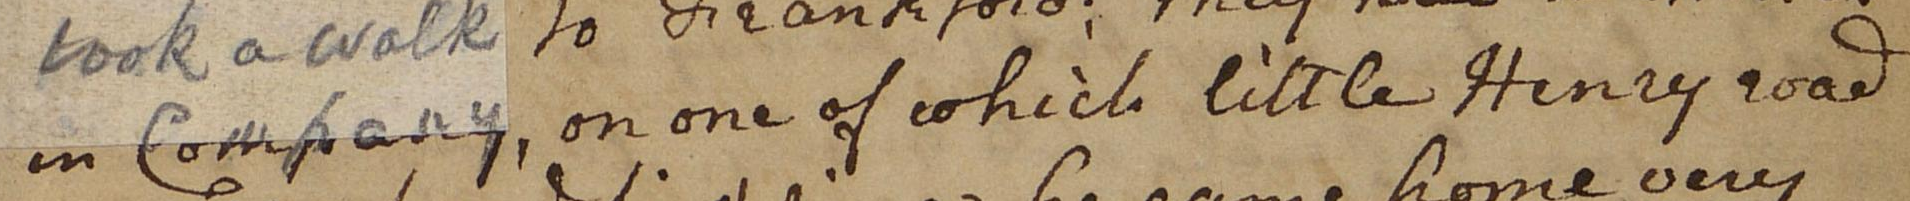in Company, on one of which little Henry road
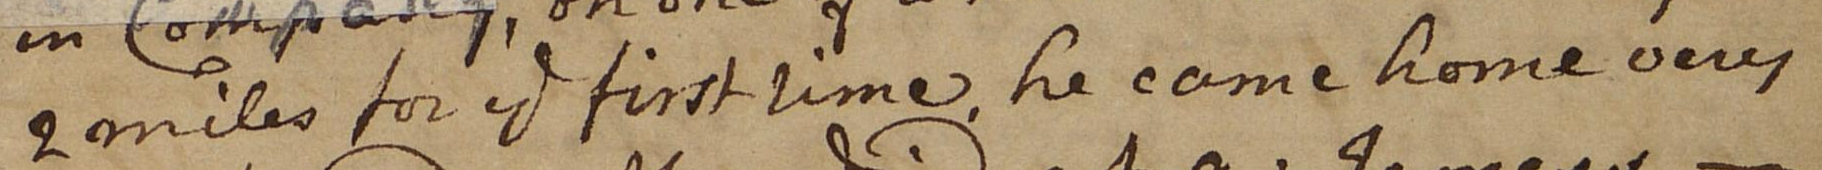2 miles for y^e first time, he came home very
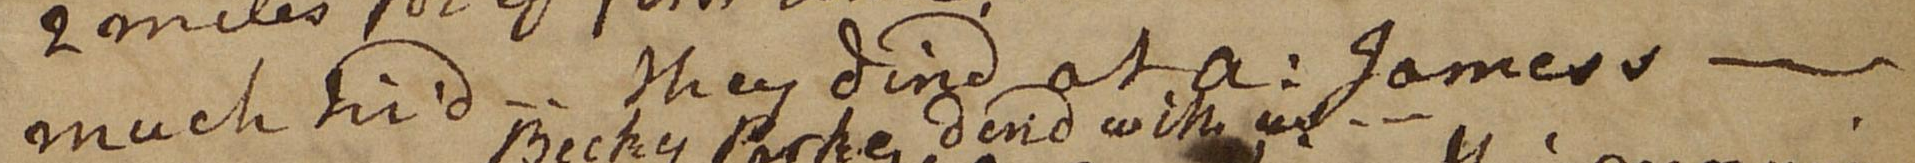much ti'd-- they dind at A: Jamess-
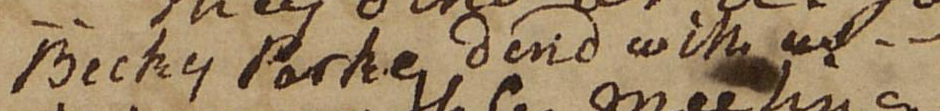Becky Parke dind with us-
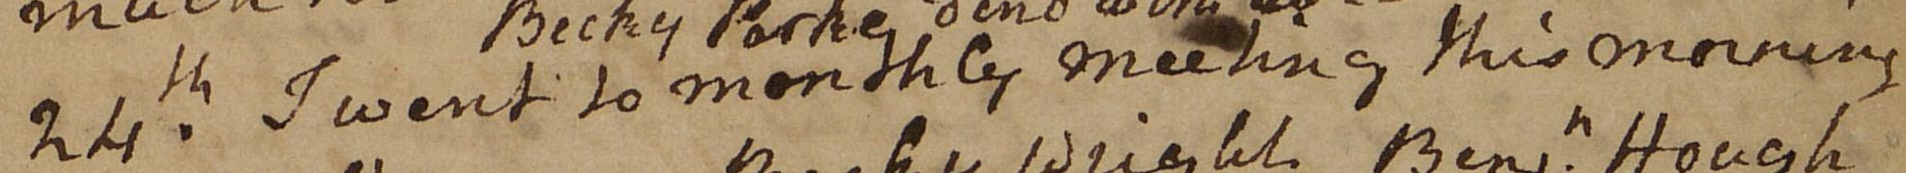24^th. I went to monthly meeting this morning
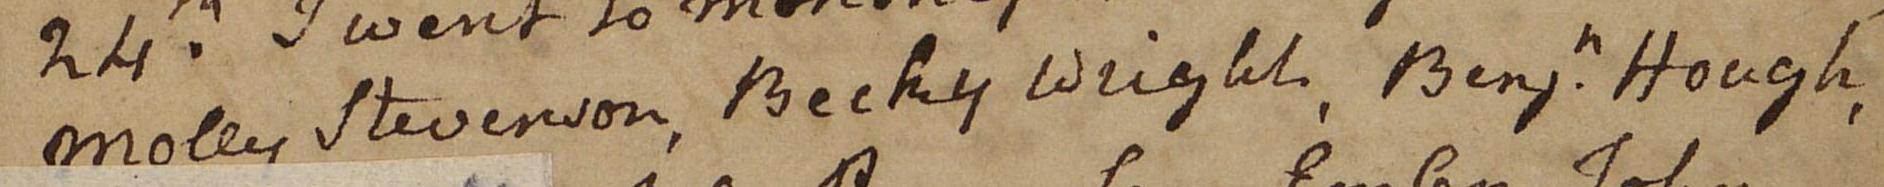Molly Stevenson, Becky Wright, Benj^n. Hough,
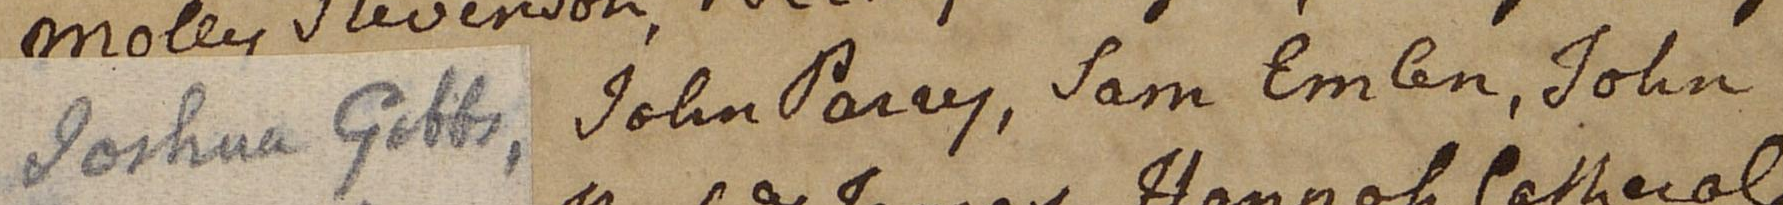Joshua Gibbs, John Parry, Sam Emlen, John
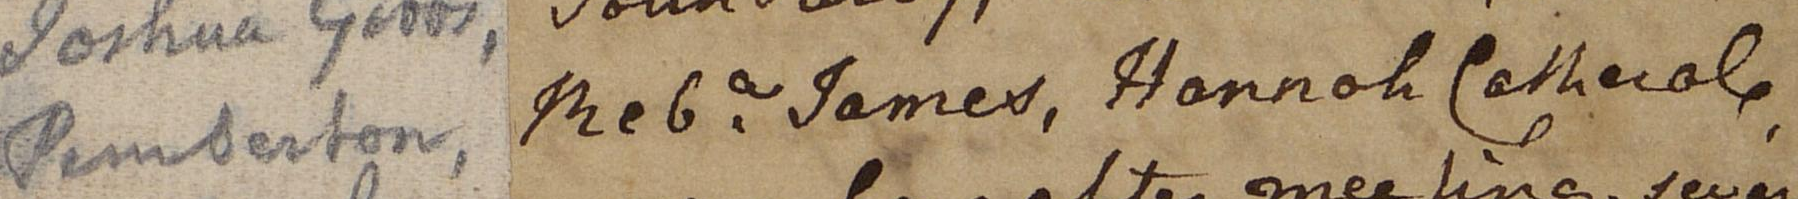Pemberton, Reb^a. James, Hannah Catheral,
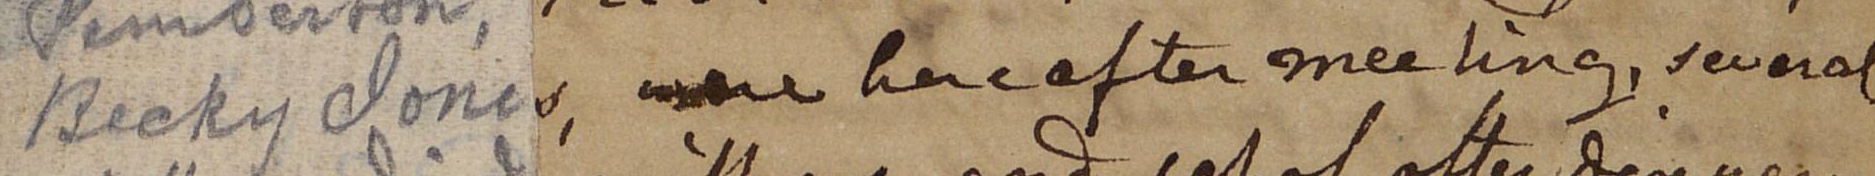Becky Jones, [___] hereafter meeting, several
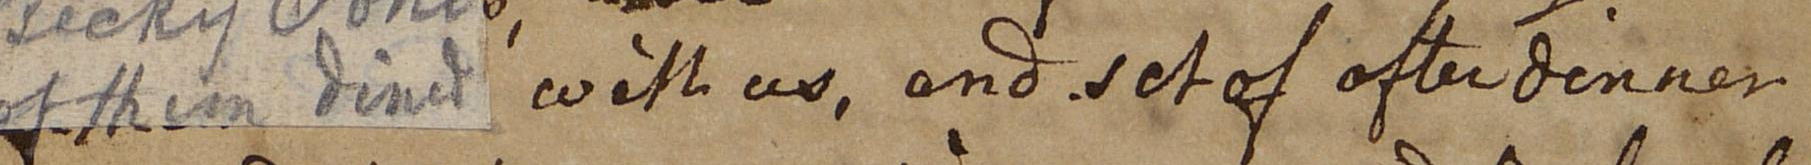of them dind with us, and set of after dinner
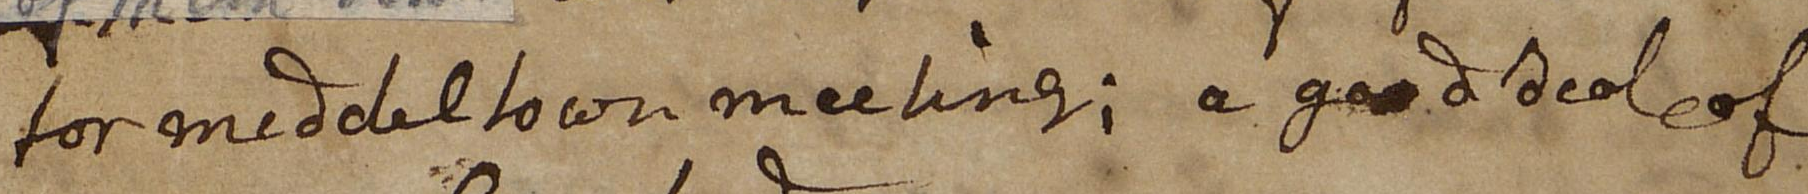for middel town meeting; a good deal of
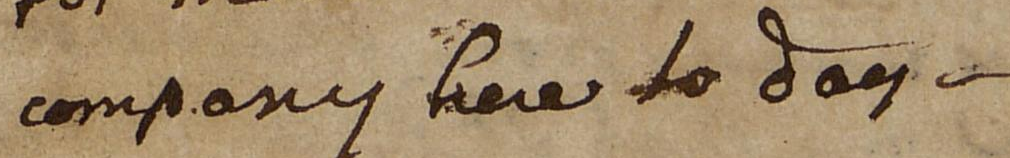company here to day-
